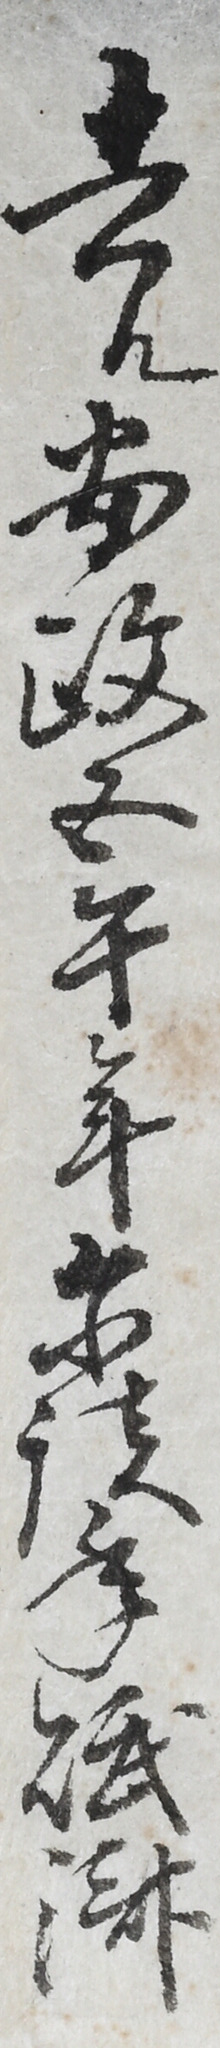去ル安政五午年示談年賦済
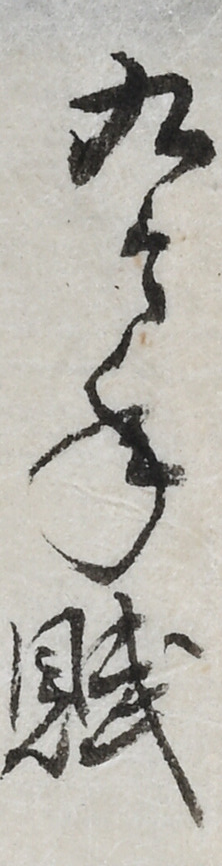九ヶ年賦
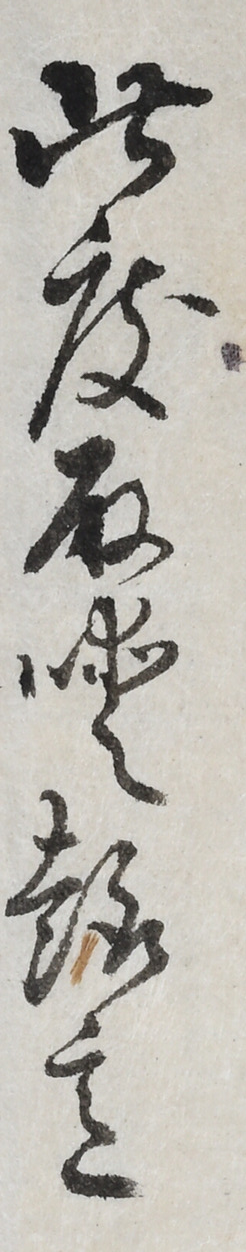此度取曖趣意
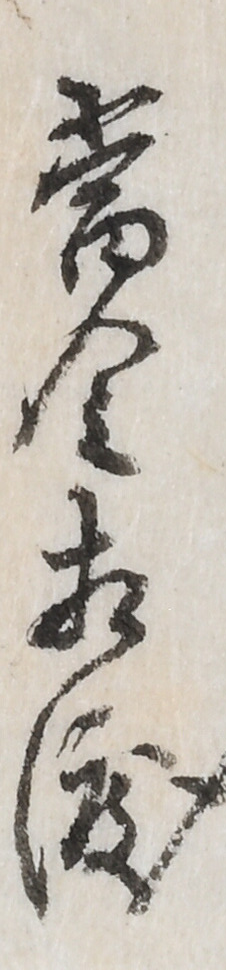当金相渡
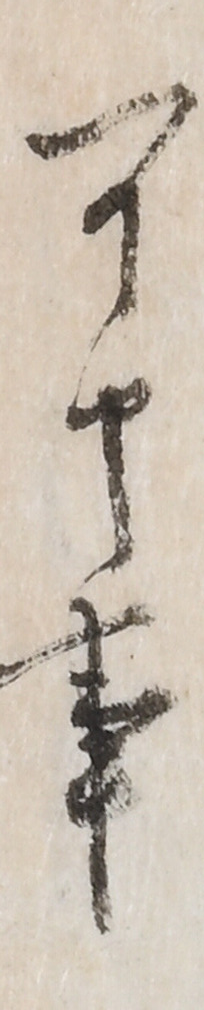可申事
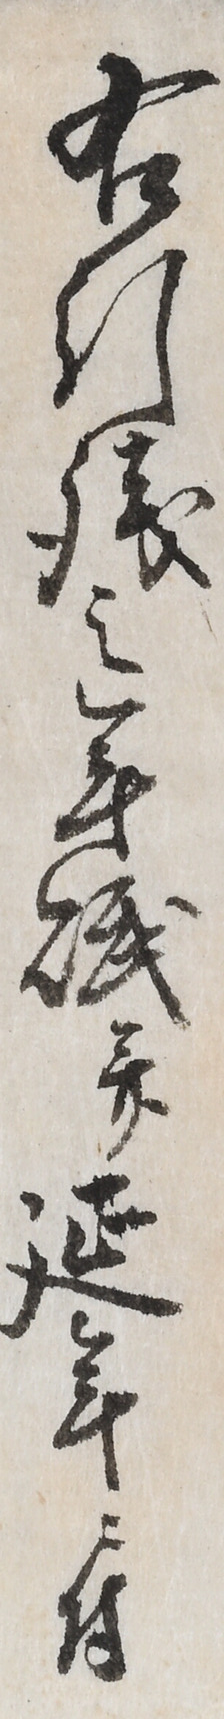右引銭之年賦并延年ニ付
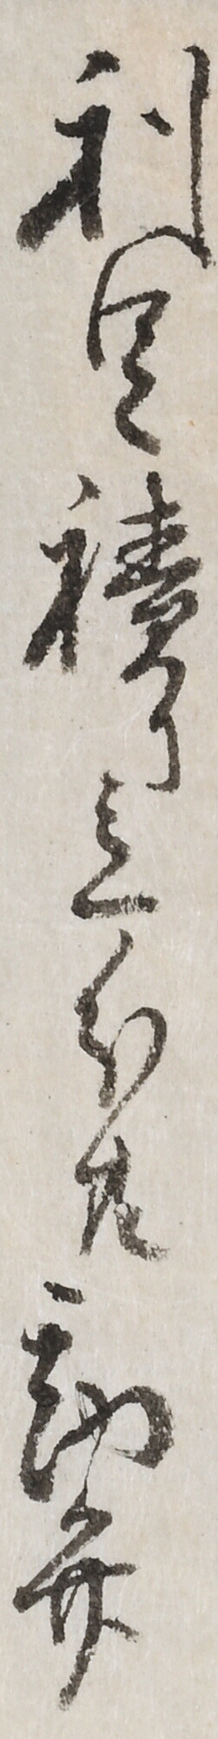利足積り立分共勘弁
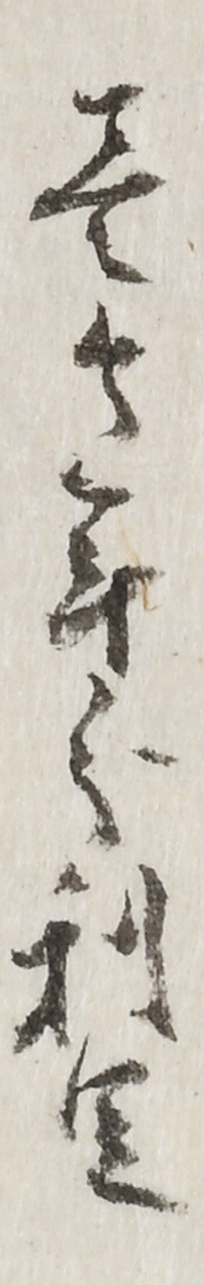壱ヶ年分利足
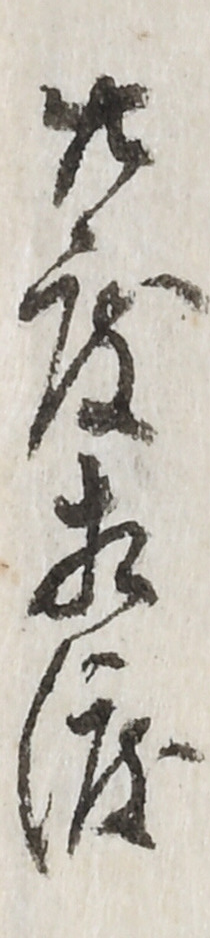此度相渡
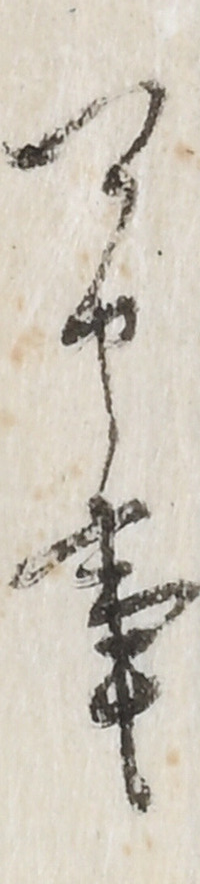可申事
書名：（貸金出入噯諸控）
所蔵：伊那市立高遠町図書館・合同会社AMANE
